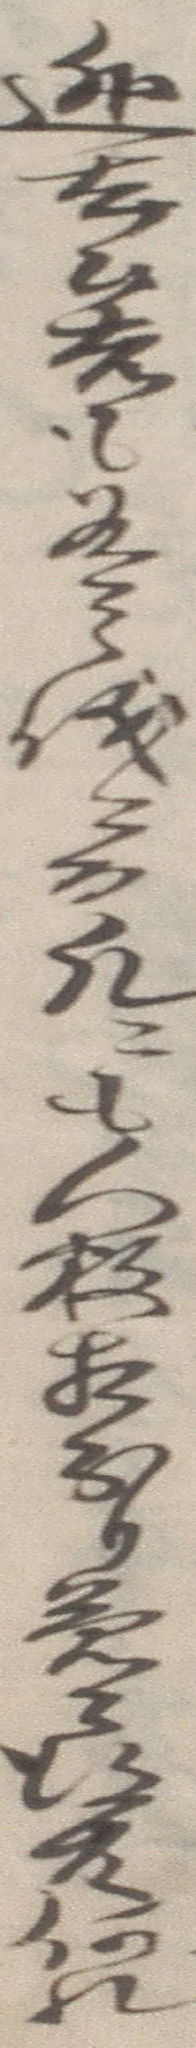逃去候者も有之儀二而凡二も人数相分兼候得共何れ
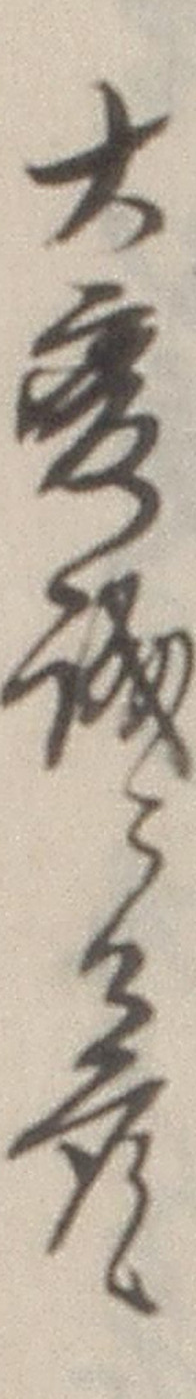大変議二御座候
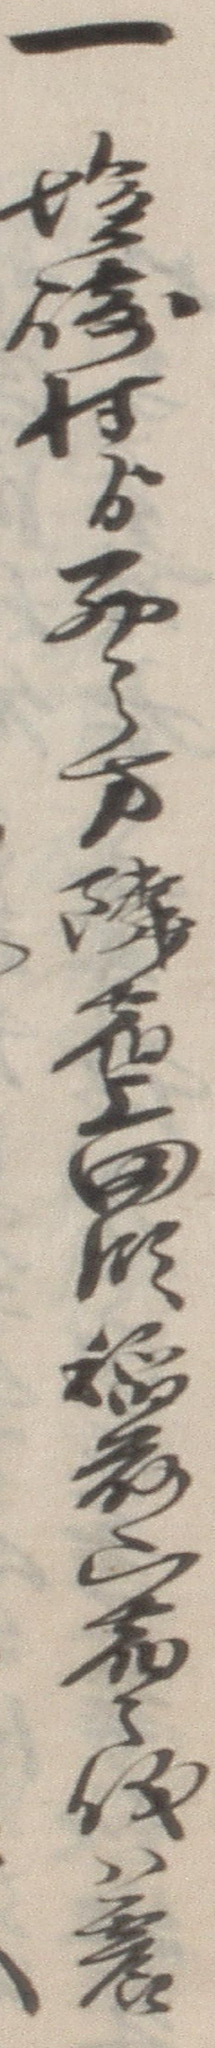一塩崎村ゟ西之方隣宿上田領稲荷山宿之儀ハ震
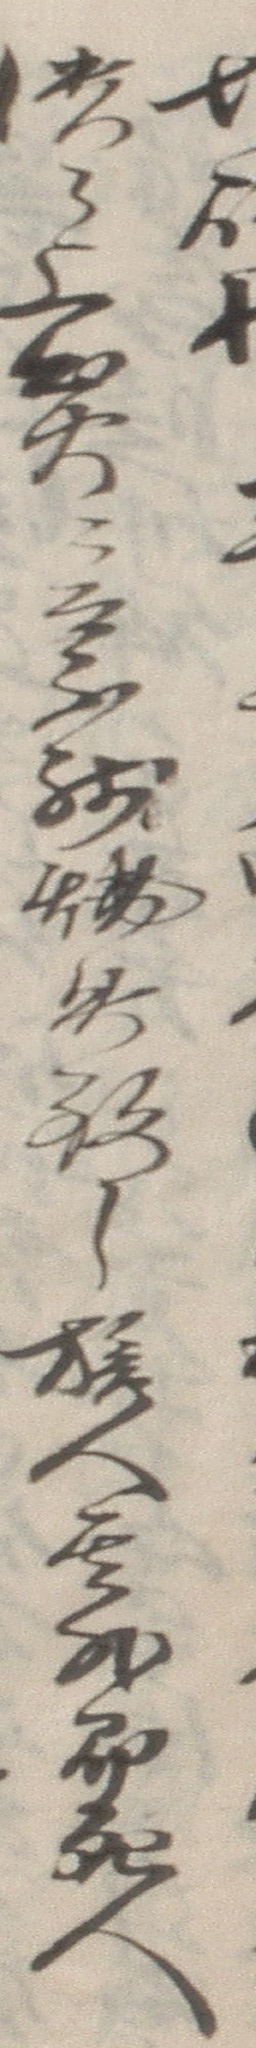潰候上出火二而不残焼失致し旅人其外即死人
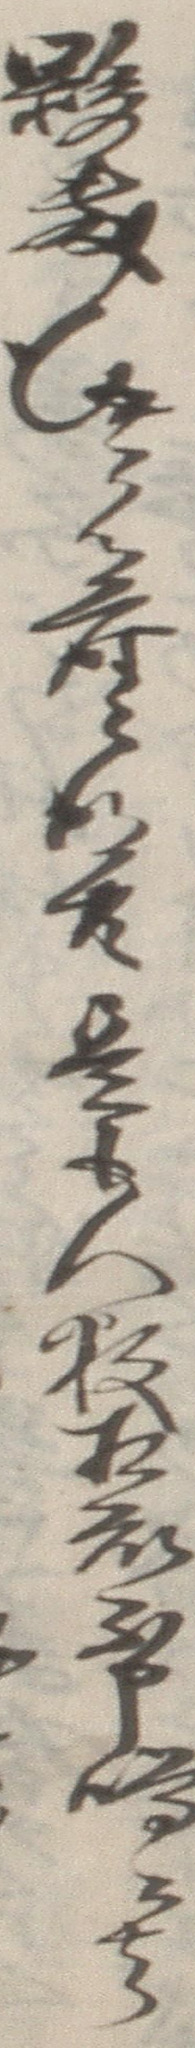夥敷趣二御座候得共是も人数相知不申噂二者
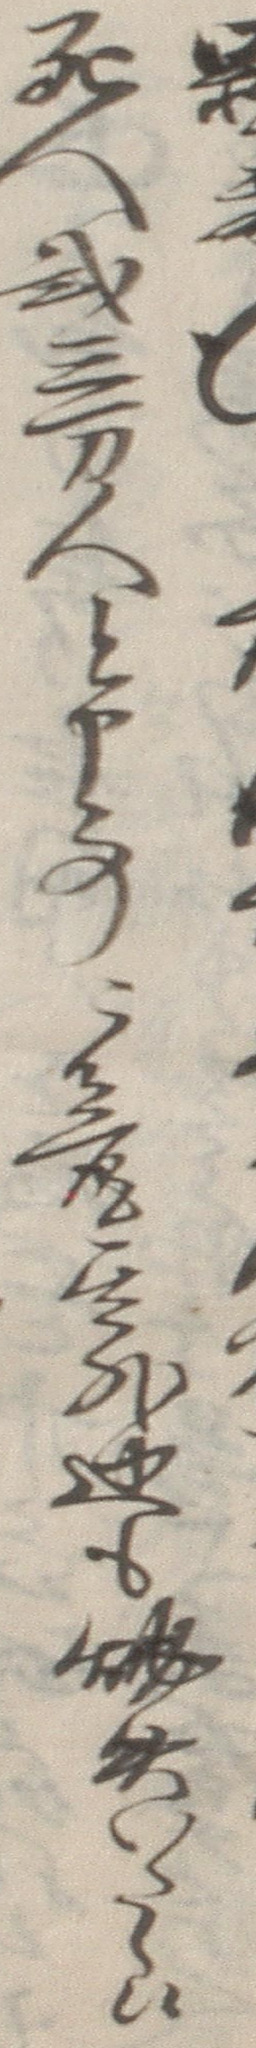死人弐三万人と申事二御座候其外迚も焼失いたし候
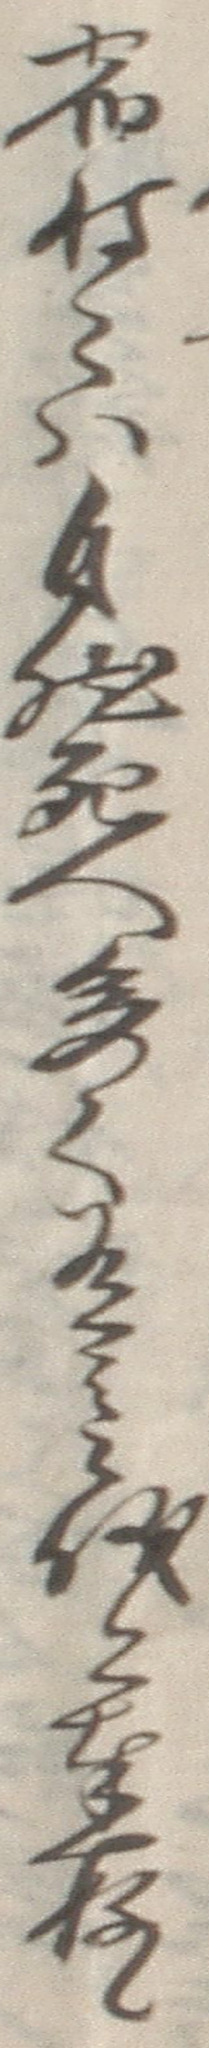宿村々ハ自然死人多く有之候儀と奉存候
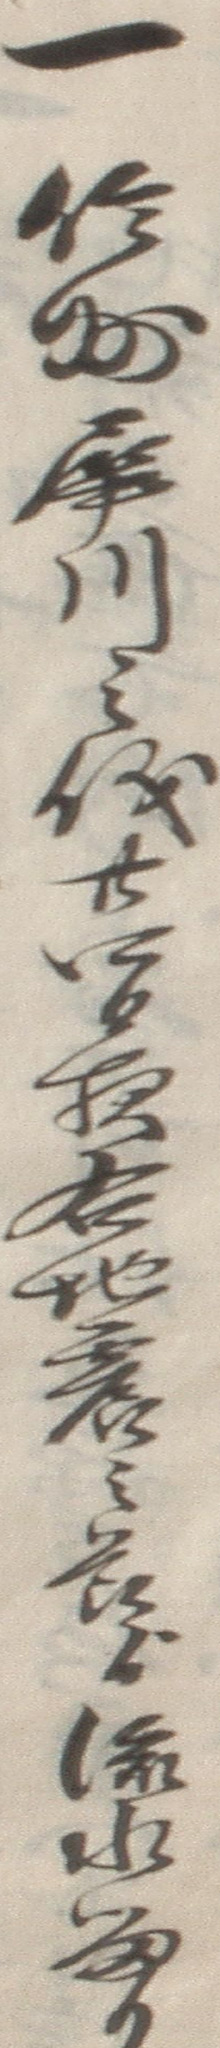一信州犀川之儀廿四日夜右地震之節ゟ流水留り
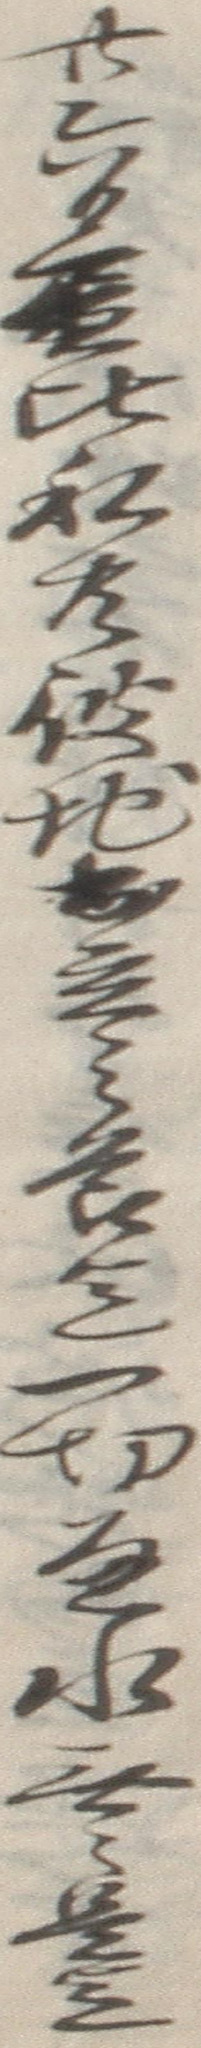廿六日昼比私共彼之地出立之節迄一切通水無之是迄
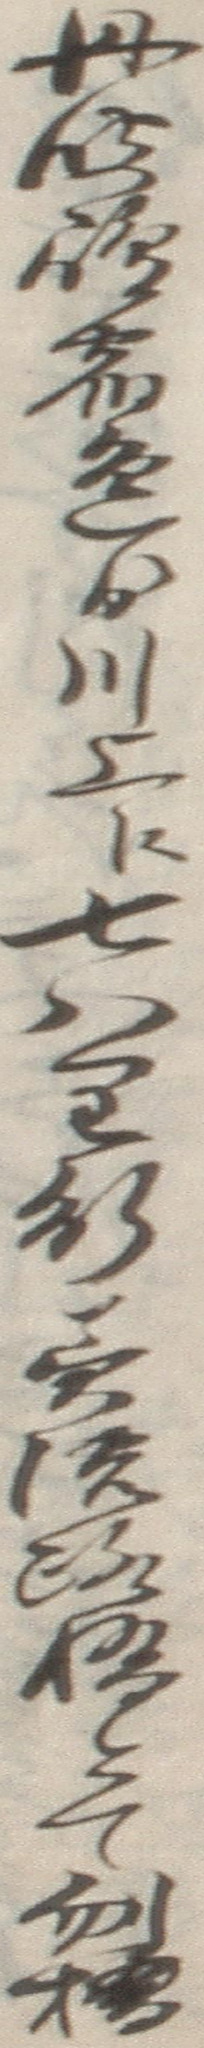丹波嶋宿辺ゟ川上江七八里行美濃路橋とて刎橋
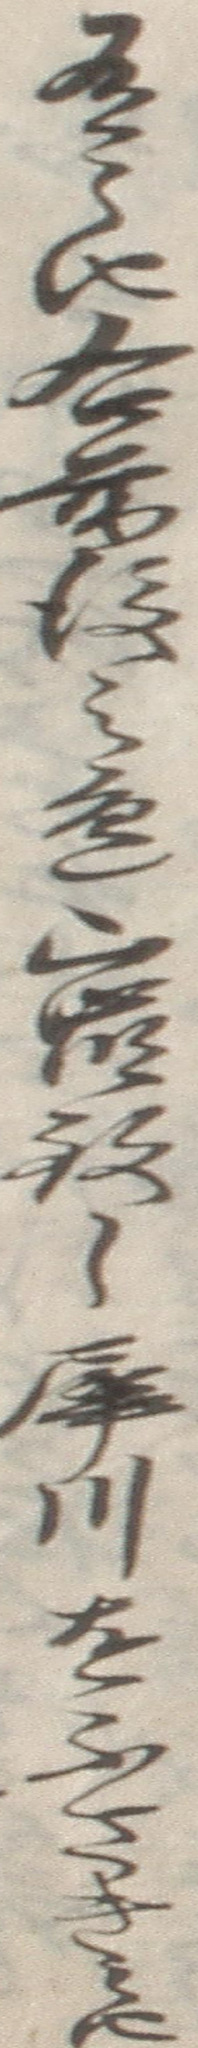有之候由右前後之辺山崩致し犀川をふさき候由
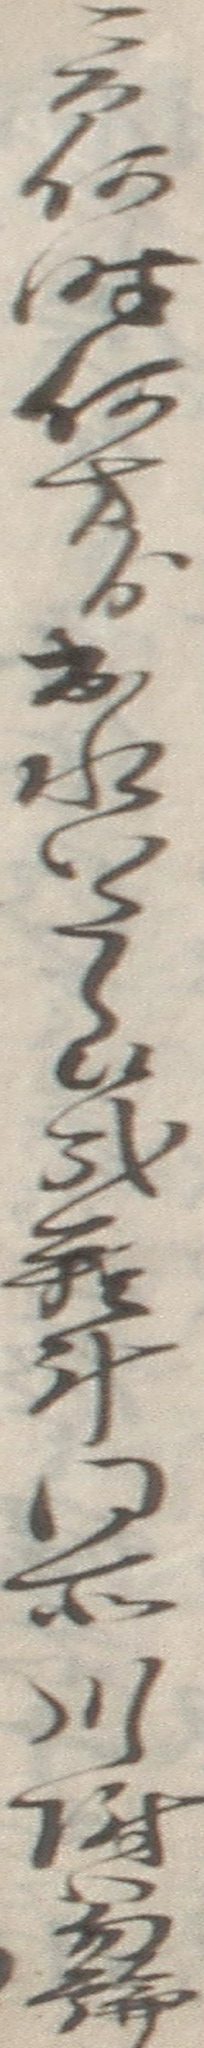二而何時何方ゟ出水いたし候哉難計同所川附ハ勿論
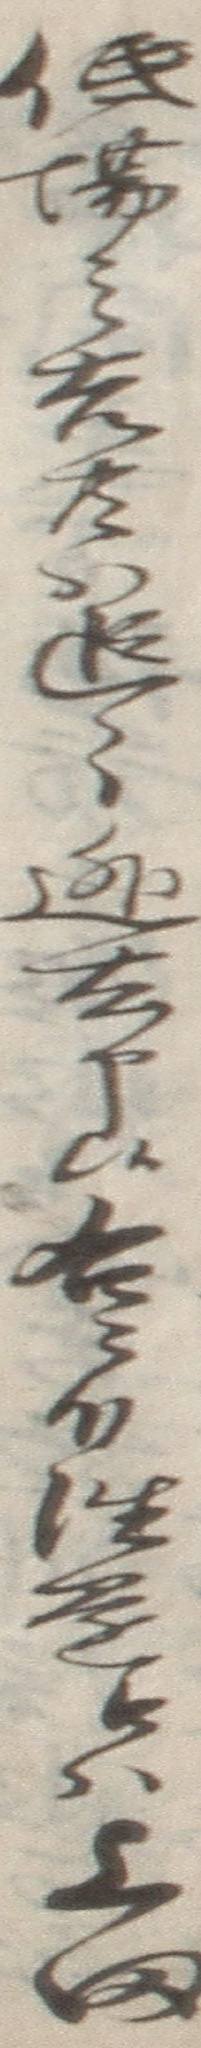低場之者共ハ追々逃去申候右二付往還江ハ上田
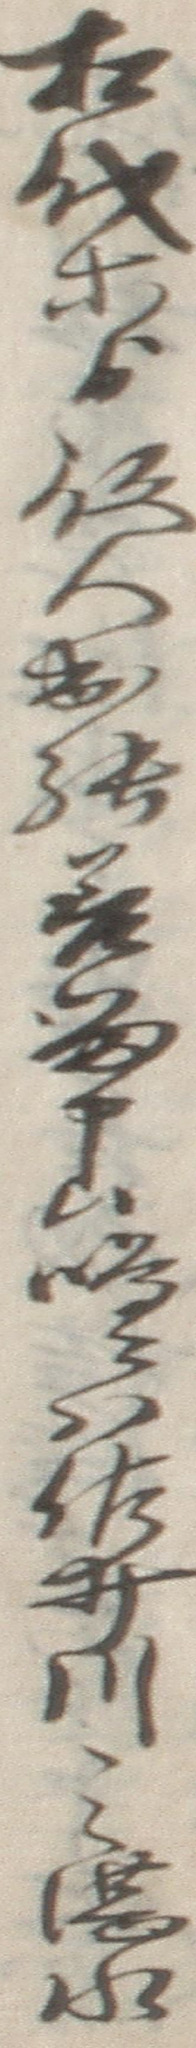松代等ゟ役人出張差留申候噂二ハ左井川之湛水

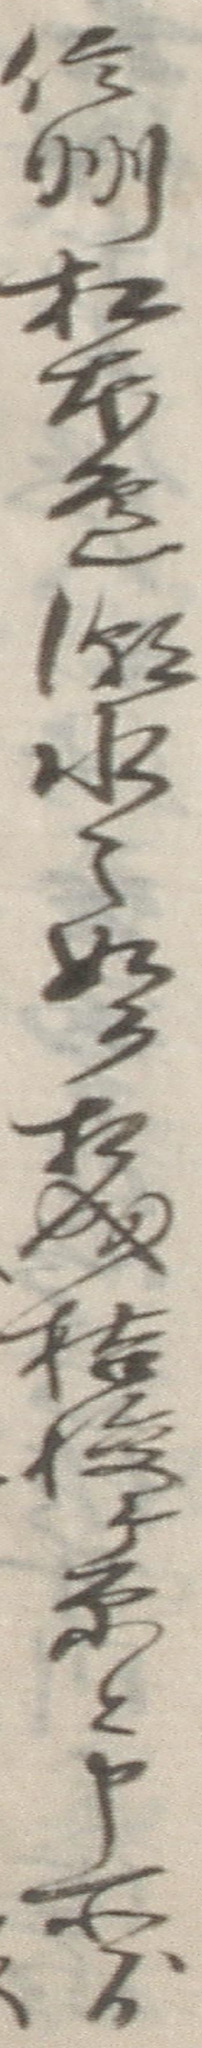信州松本辺激水之如ク相成桔梗ヶ原と申所ゟ
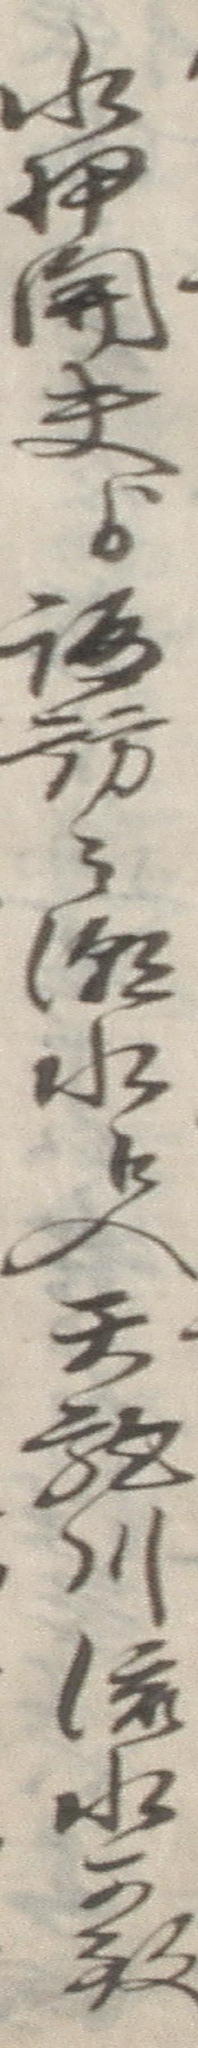水押開夫ゟ諏訪之激水江入天流川流水可致
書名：信州地震一件
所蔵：東京大学地震研究所図書室 Earthquake Research Institute Library, The University of Tokyo, JAPAN
